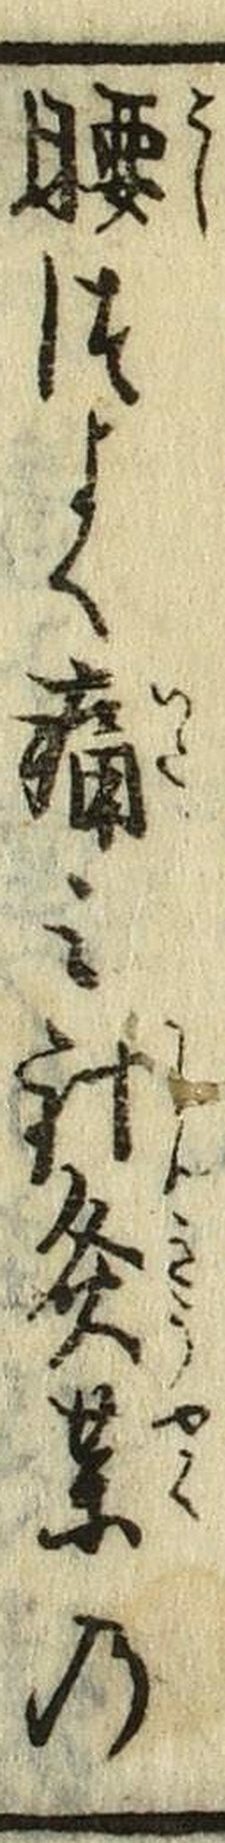腰つよく痛み針灸薬の
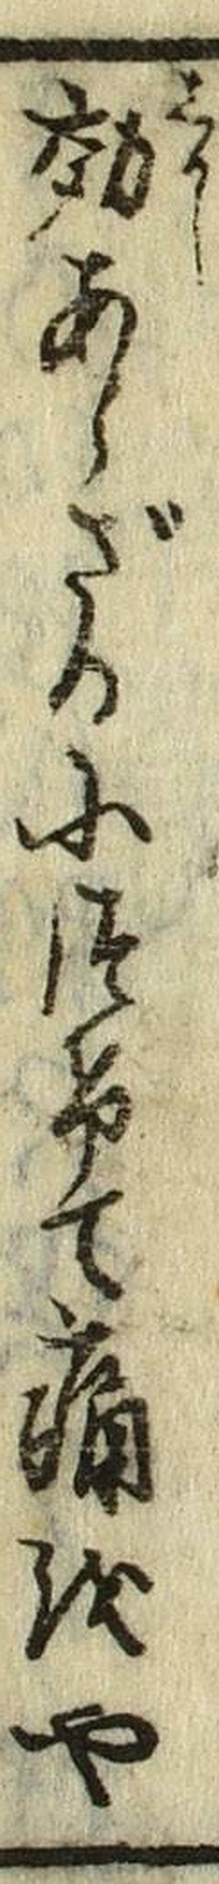効あらざるにつけて痛をや
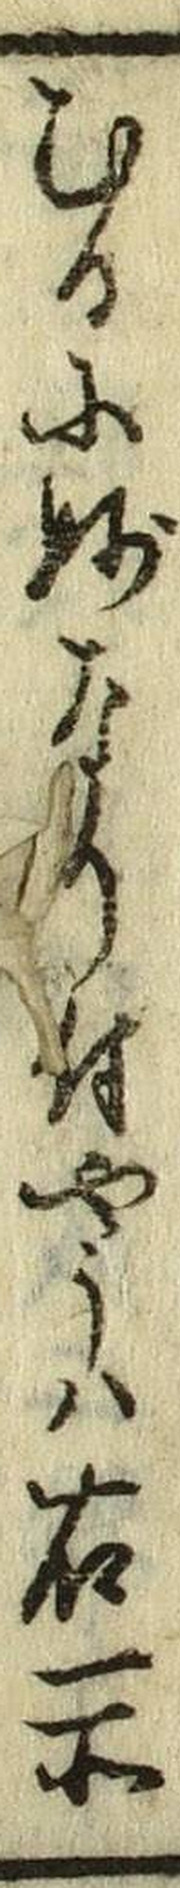むるに妙なり付やうは右一所
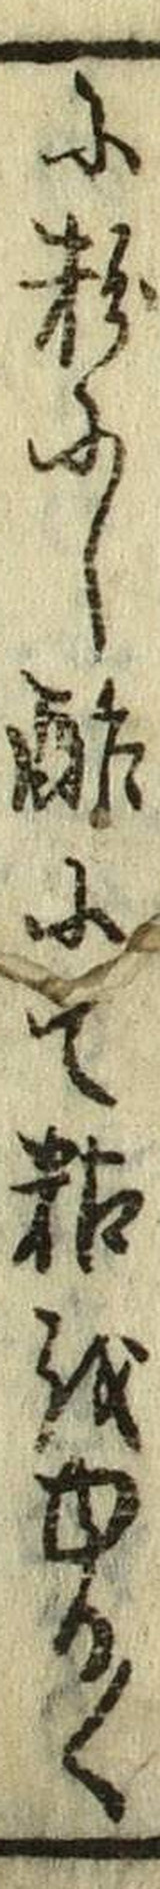に粉にし酢にて粘をゆる〳〵
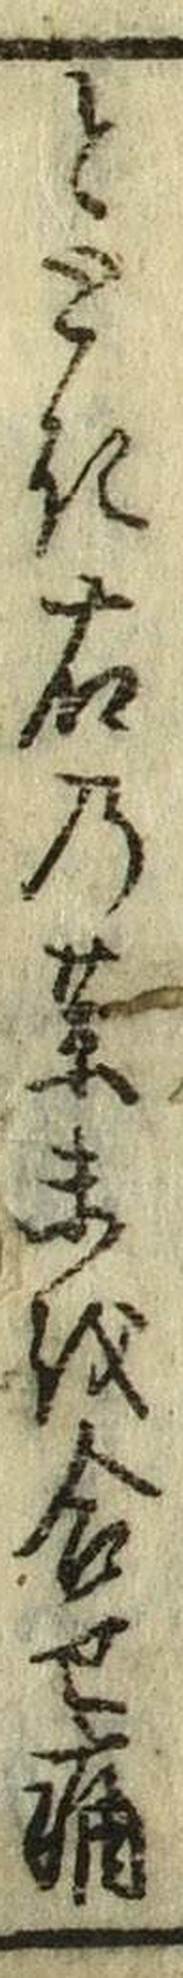ととき右の薬末を合せ痛
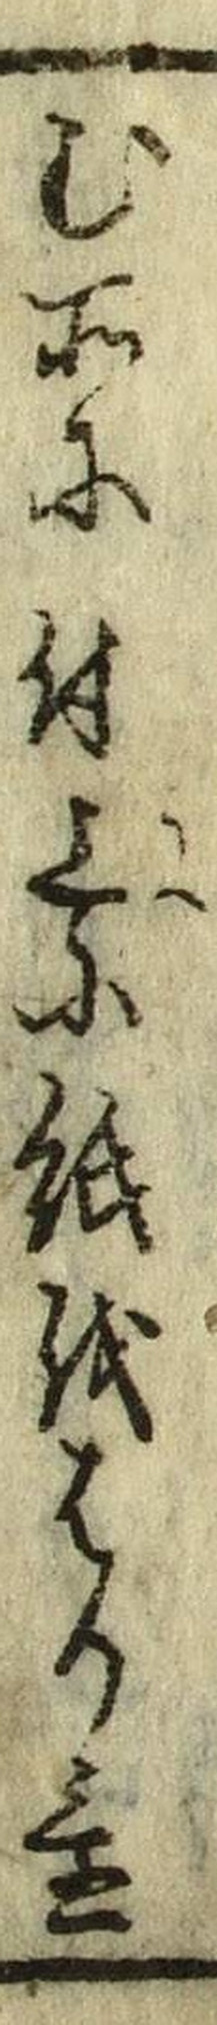む所に付上に紙をはり置

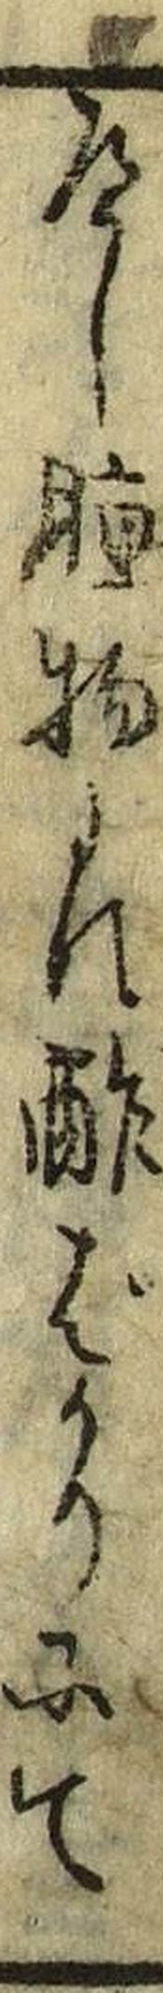へし腫物には酢ばかりにて
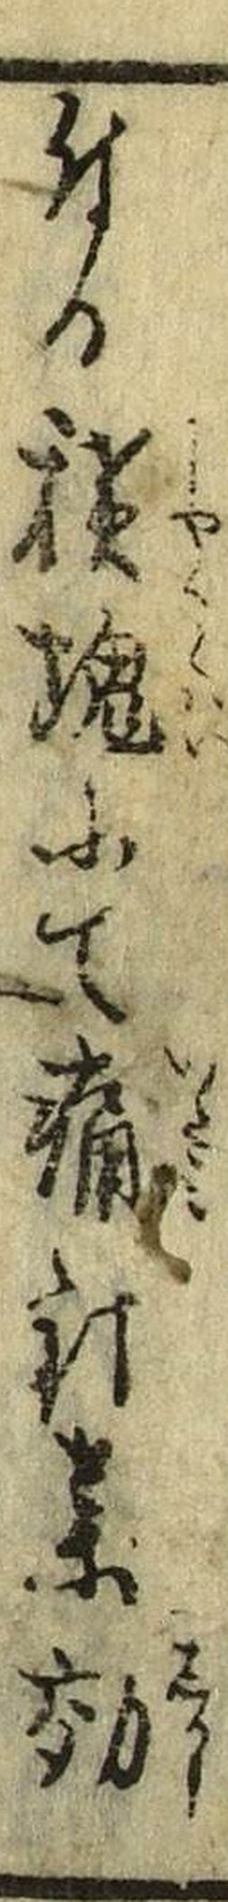付る積塊にて痛針薬効
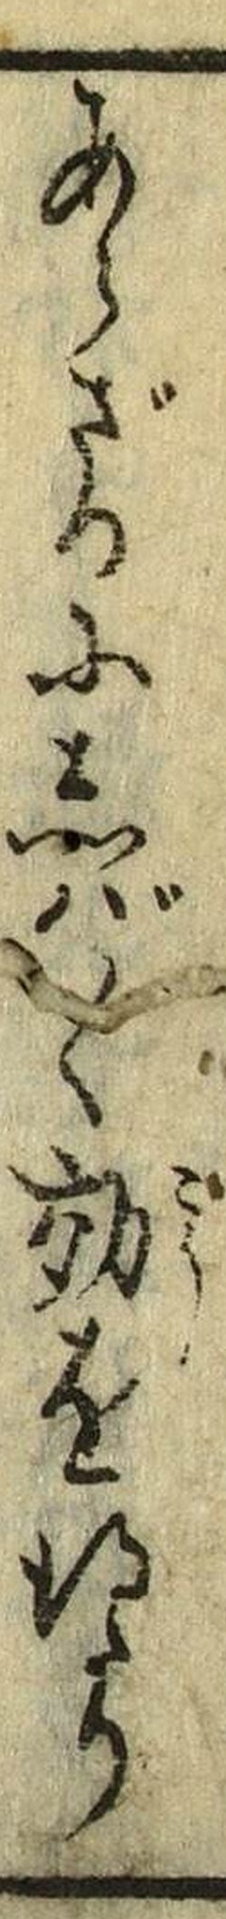あらざるにしば〳〵効を得たり
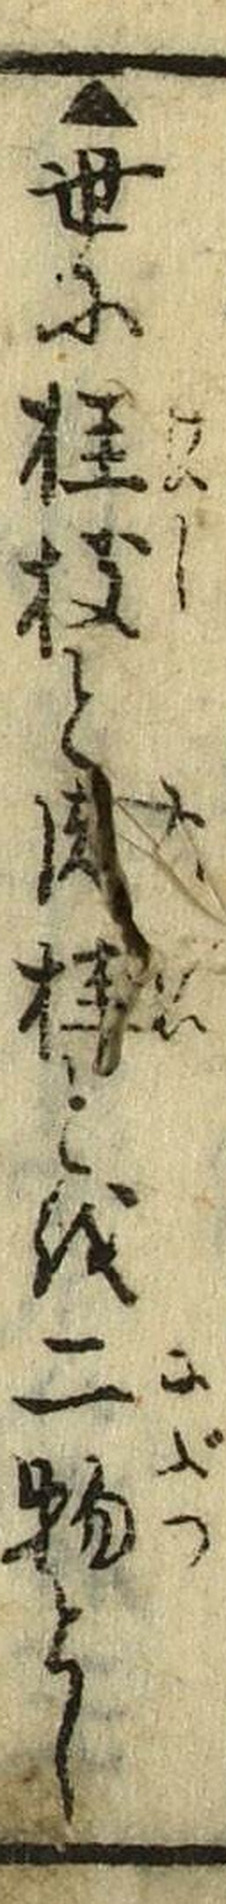▲世に桂枝と肉桂とを二物とし
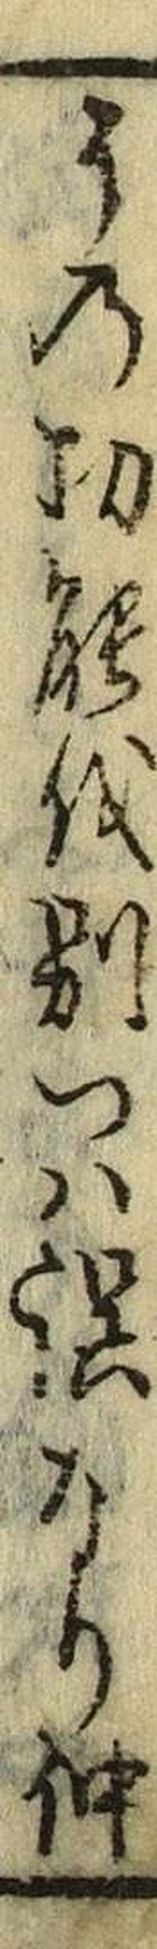その功能を別つは誤なり仲
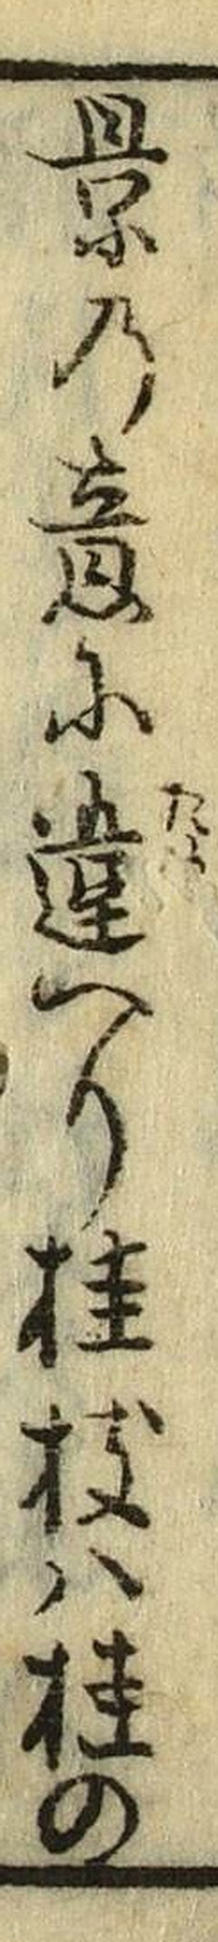景の意に違へり桂枝は桂の
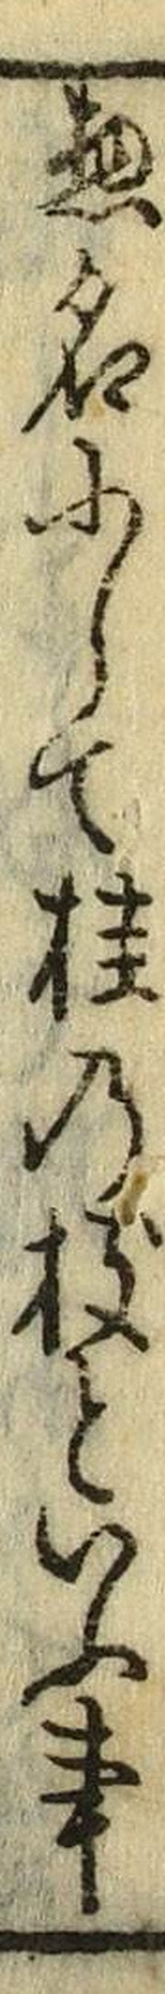総名にして桂の枝といふ事
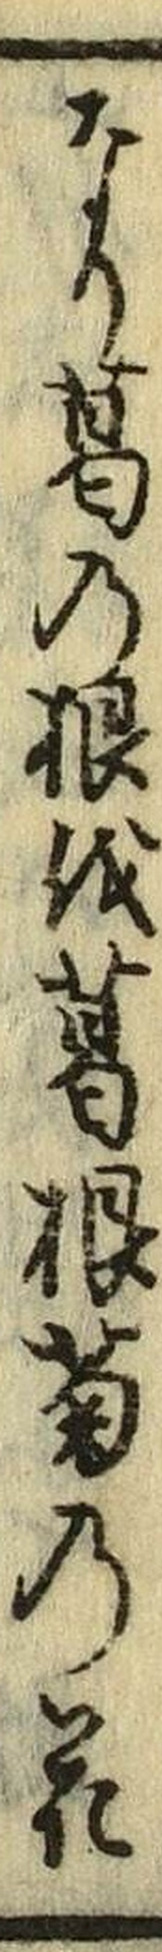なり葛の根を葛根菊の花
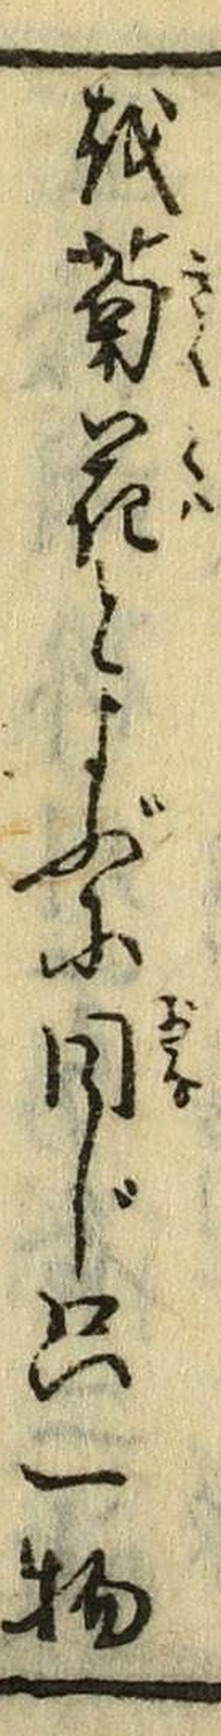を菊花とよぶに同じ只一物
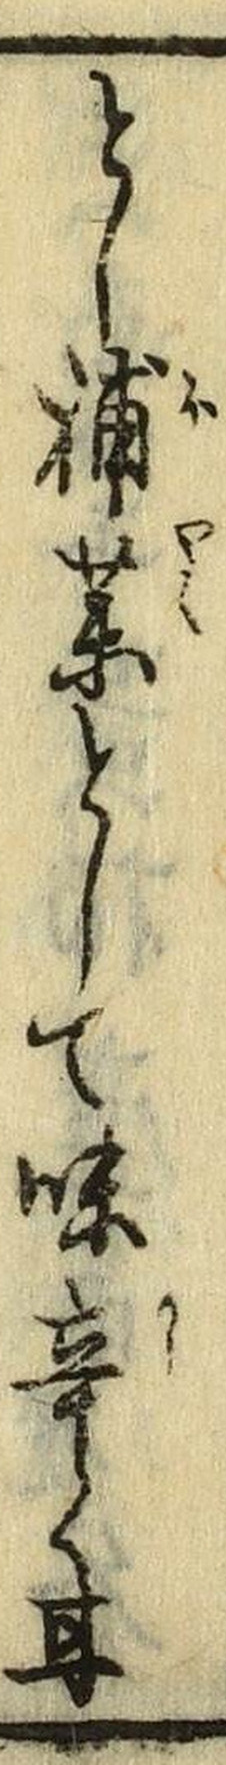とし補薬として味辛く甘
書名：居家養生記
